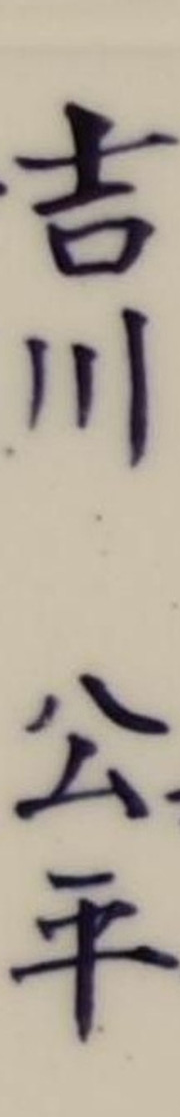吉川公平

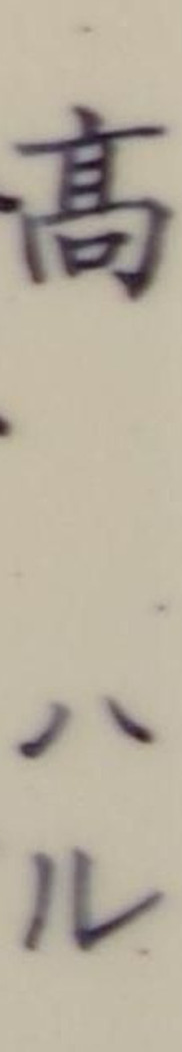高ハル
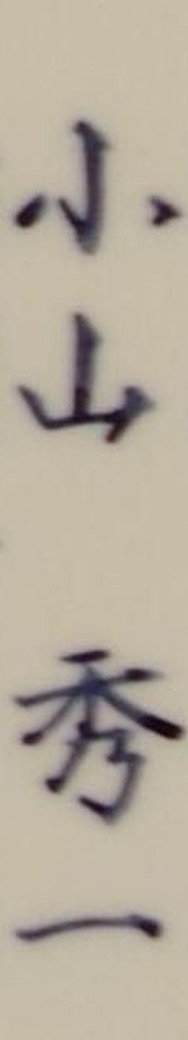小山秀一
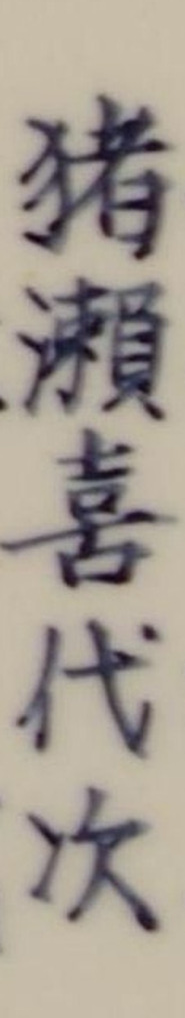猪瀬喜代次
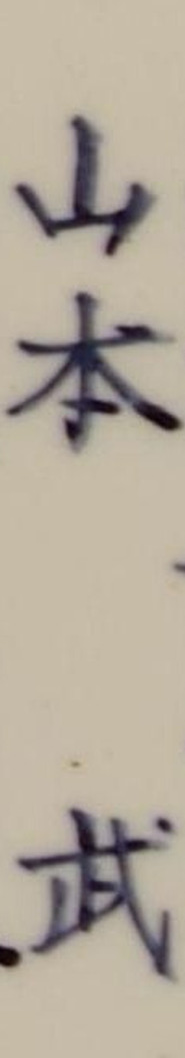山本武
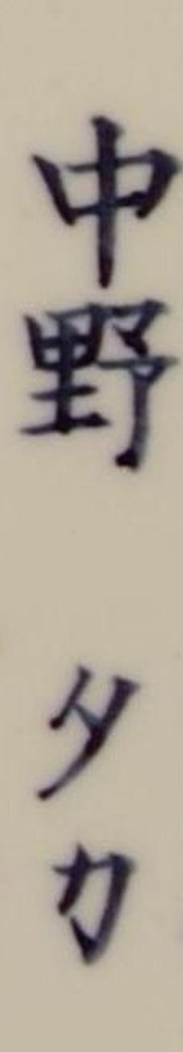中野夕カ
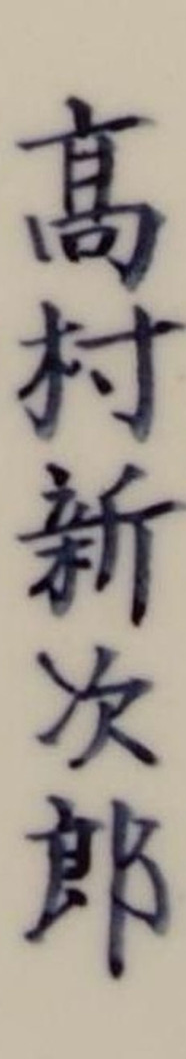高村新次郎
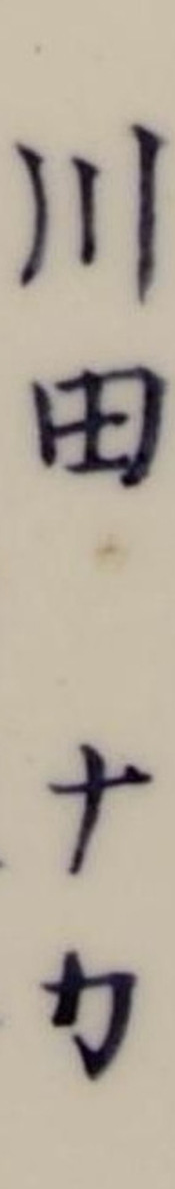川田ナカ
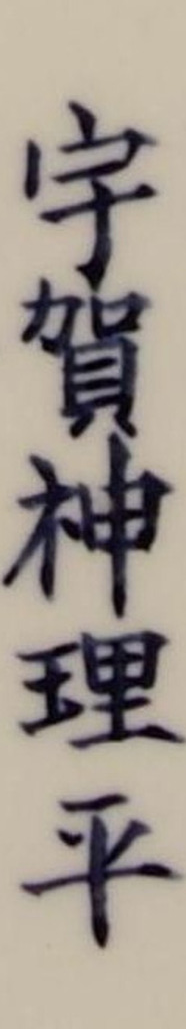宇賀神理平
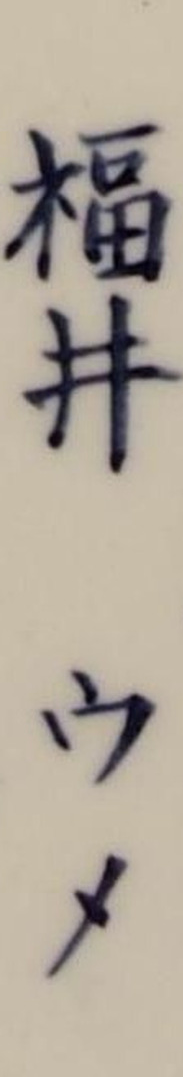福井ウメ
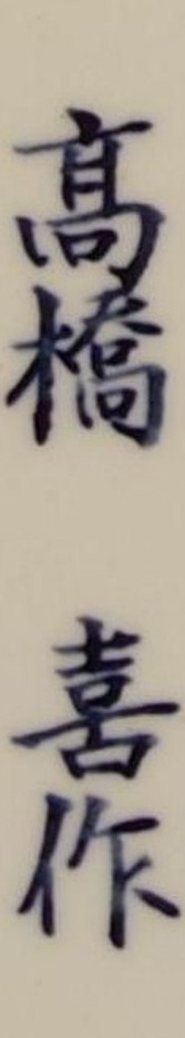高橋喜作
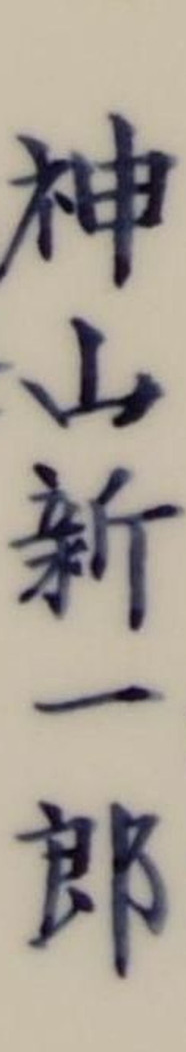神山新一郎
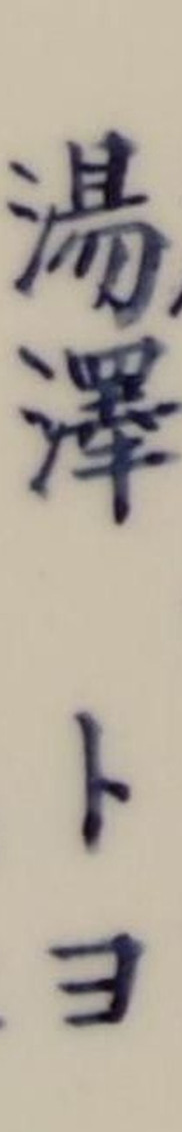湯澤トヨ

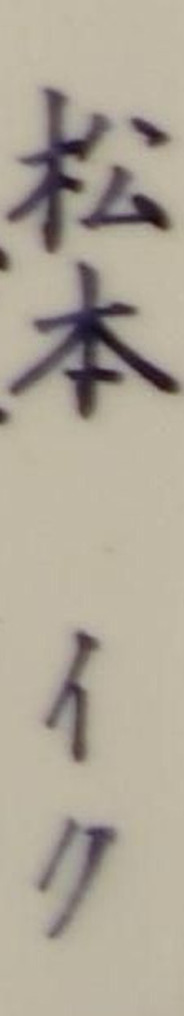松本イク
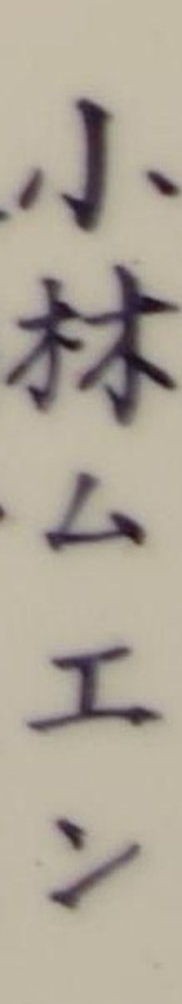小林ムエン
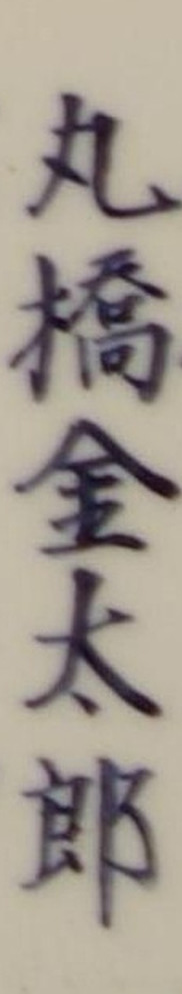丸橋金太郎
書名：E~L
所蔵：高野山金剛峯寺
